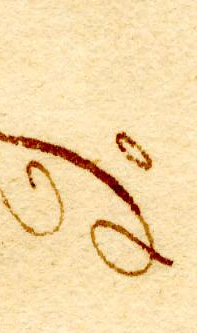To
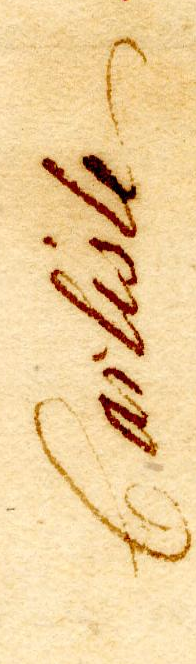Carlisle
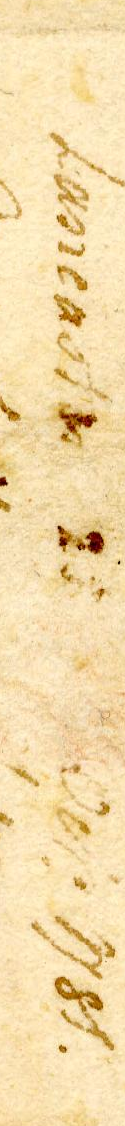Lancaster 25 Oct^r 1781.
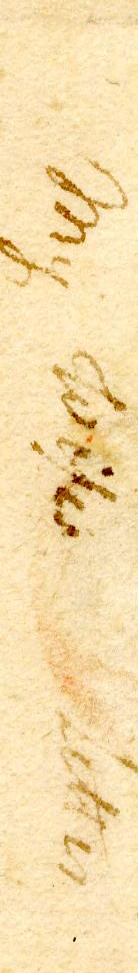My Wife's Letter
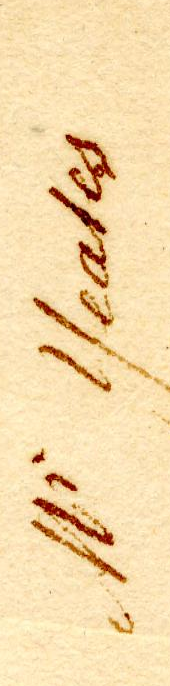M^r Yeates
